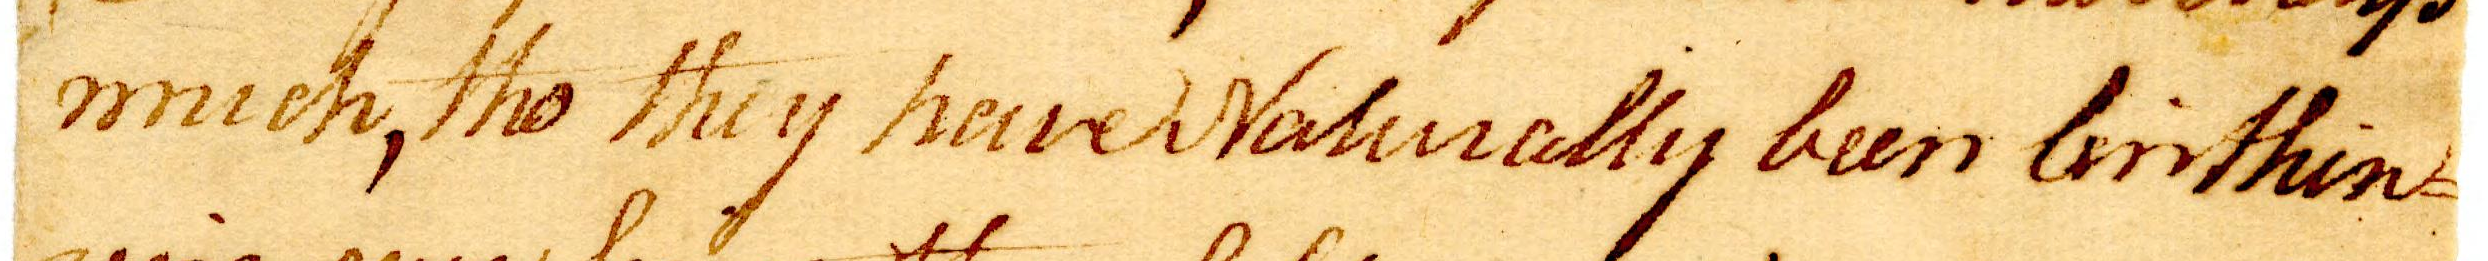much, tho they have Naturally been brithin-
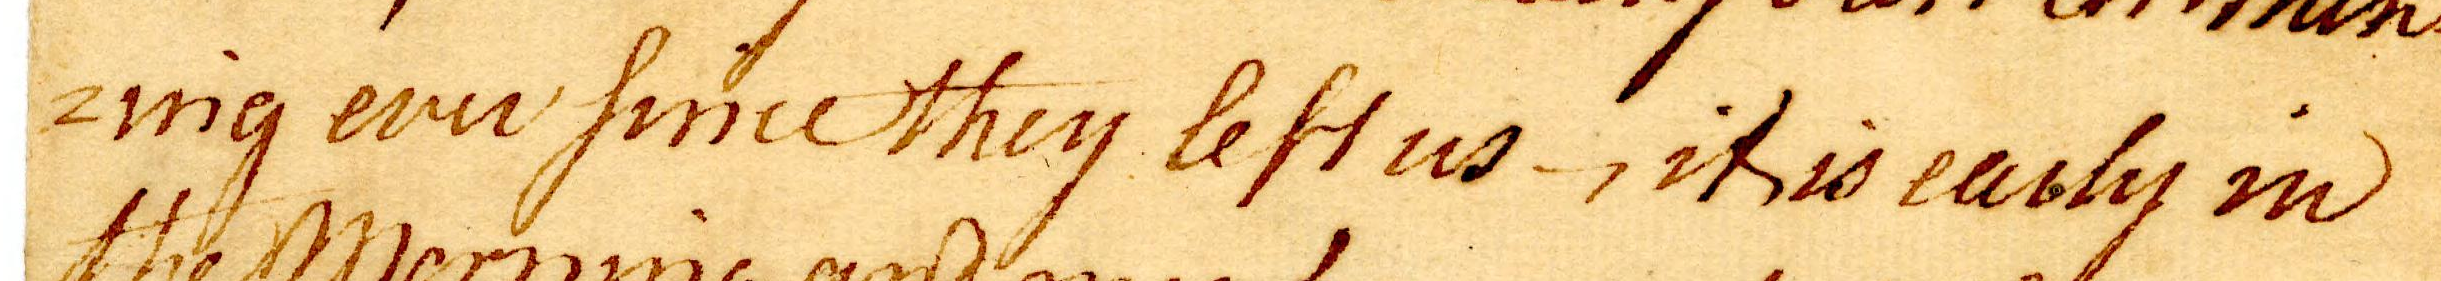-ing ever since they left us. it is early in
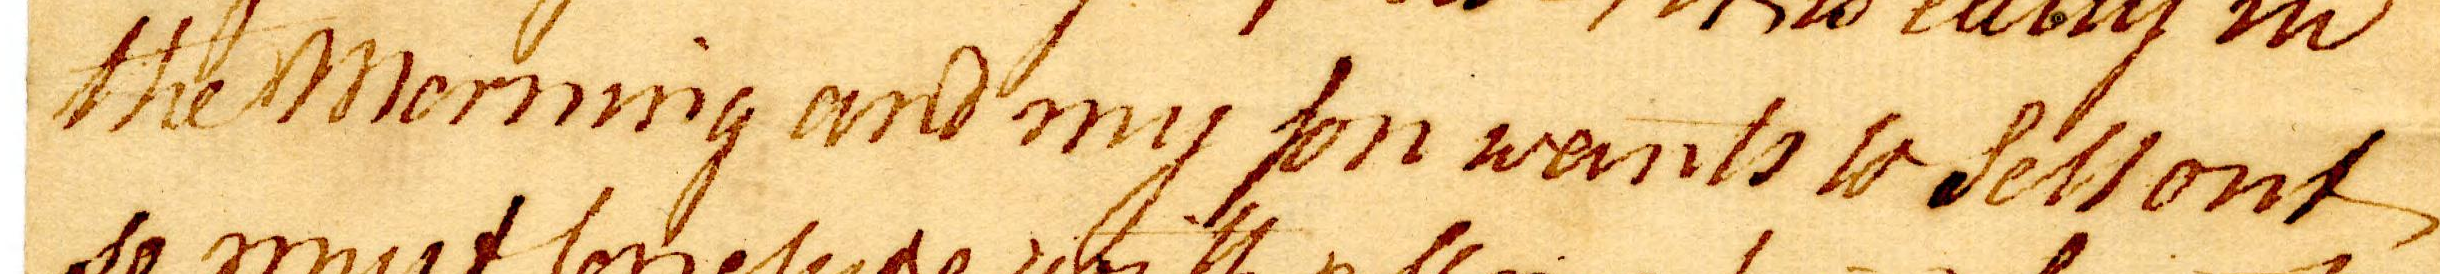the Morning and my son wants to Sell out
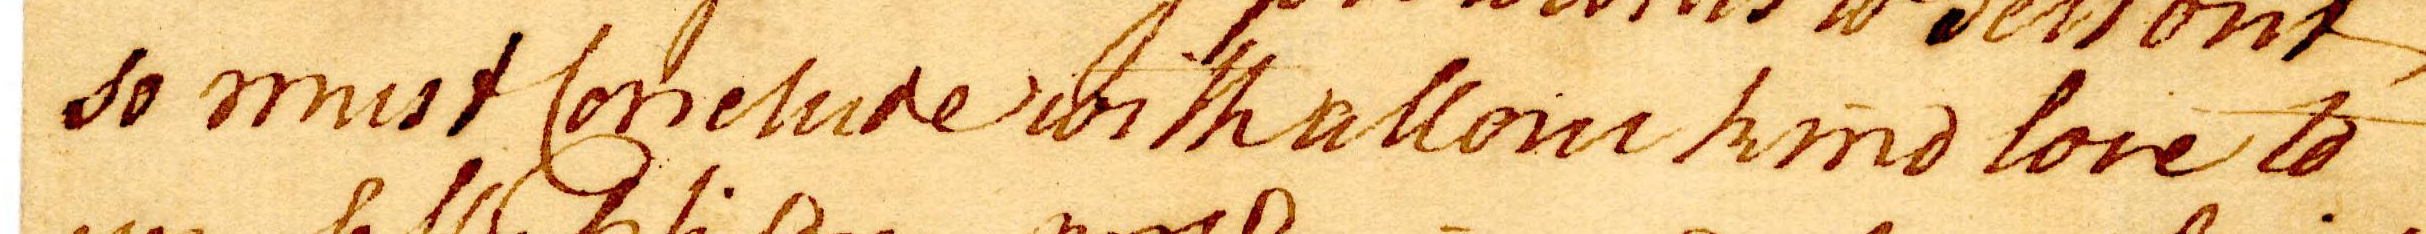so must Conclude with all our kind love to
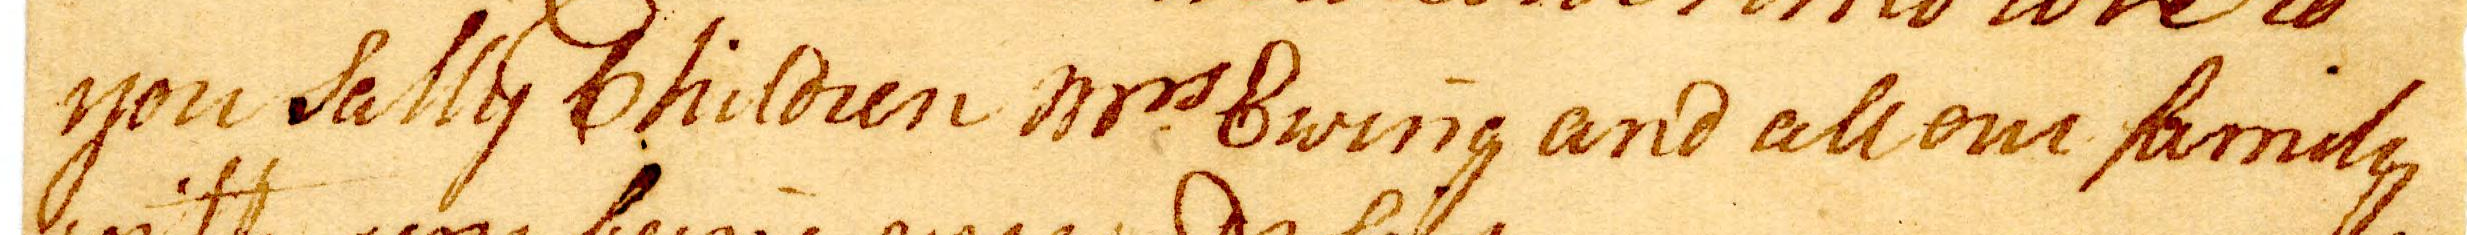you Sally Children M^rs. Ewing and all our family
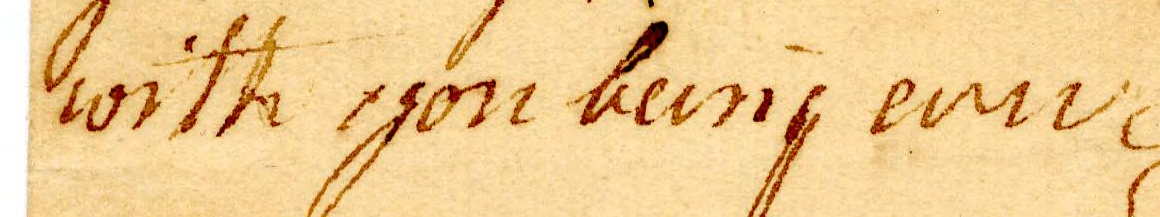with you being ever
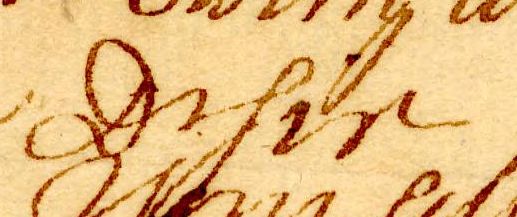D^r Sir
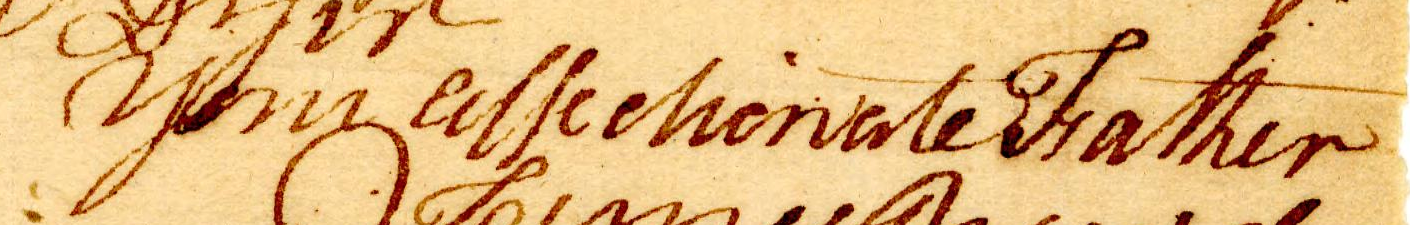Your affectionate Father
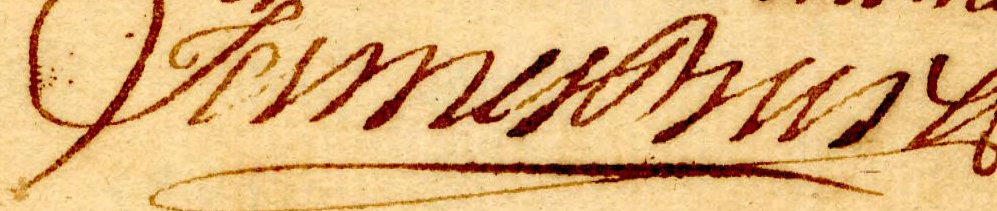James Burd
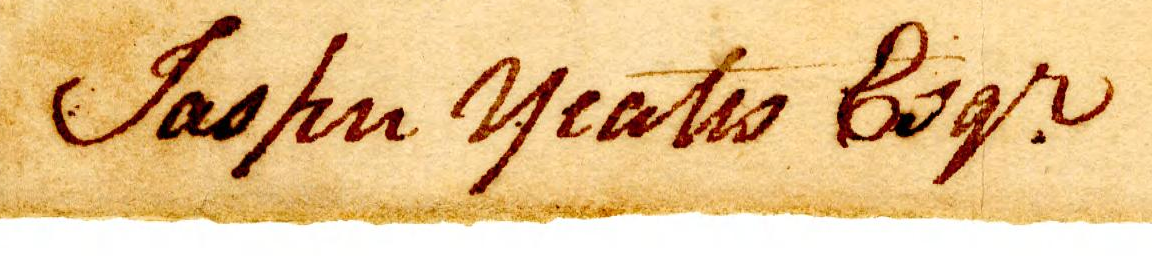Jasper Yeates Esq^r.
